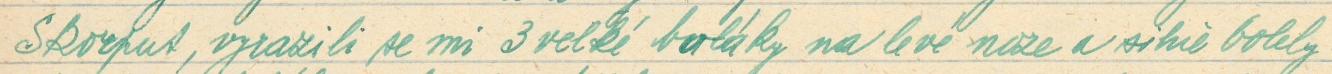Skorput, vyrazili se mi 3 velké boláky na levé noze a silně bolely.
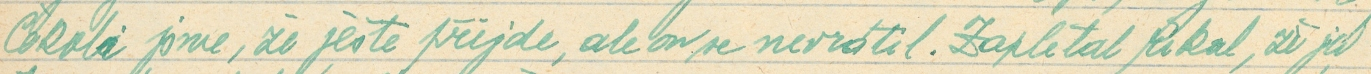Čekali jsme, že ještě přijde, ale on se nevrátil. Zapletal říkal, že já
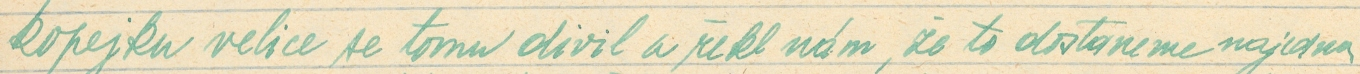kopejku velice se tomu divil a řekl nám, že to dostaneme najednou
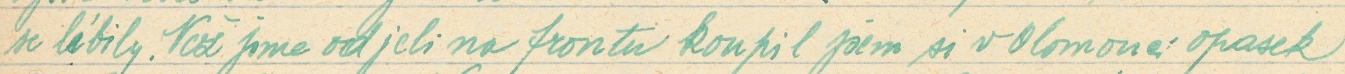se líbily. Než jsme odjeli na frontu koupil jsem si v Olomouci opasek
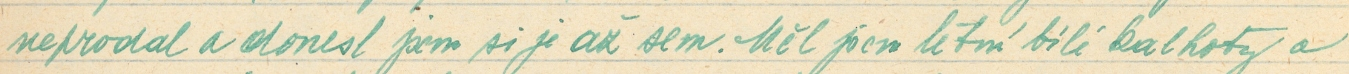neprodal a donesl jsem si je až sem. Měl jsem letní bílé kalhoty a
